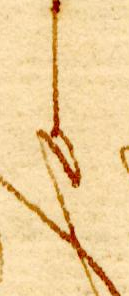To
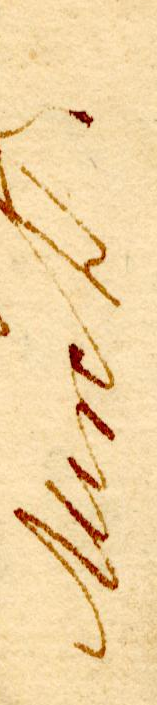Merch^t.
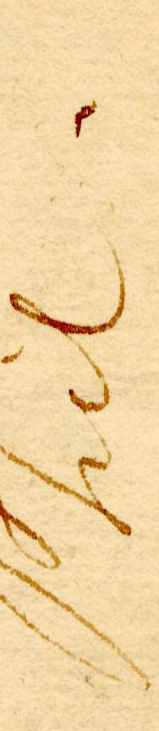Phil^a.
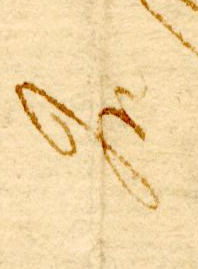In
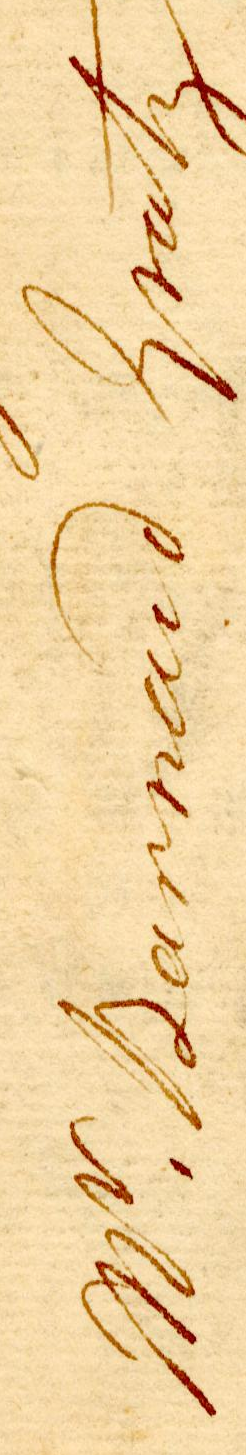M^r Barnard Gratz
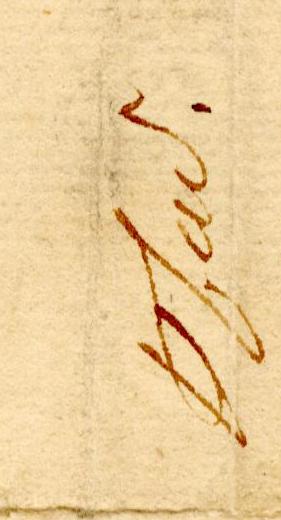per fav^r
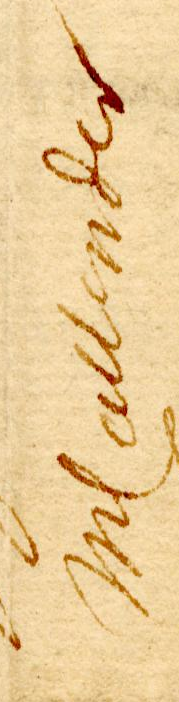M^r Callender
